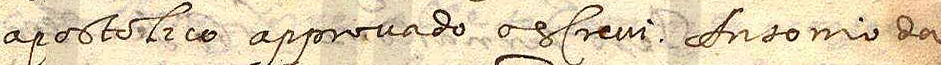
apostolico approuado o esCreui. Antonio da
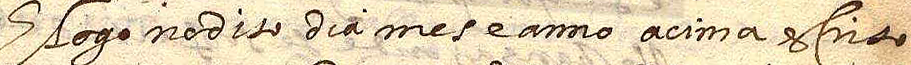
E Logo no dito dia mes e anno acima esCrito
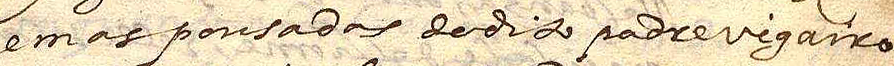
em as pousadas do dito padre vigairo
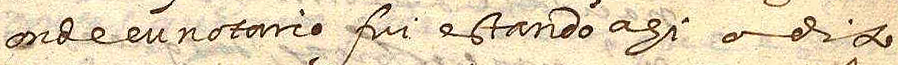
onde eu notario fui estando ahi o dito
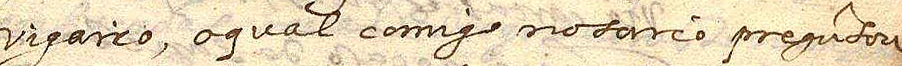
vigairo, o qual comigo notario pregūtou
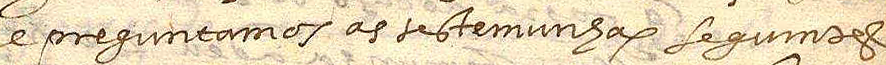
e preguntamos as testemunhas seguintes
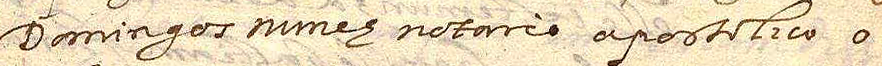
Domingos nunes notario apostolico o
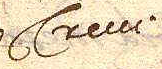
esCreui
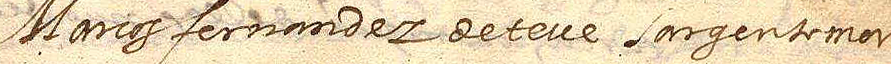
Marcos fernandez de teue sargento mor
